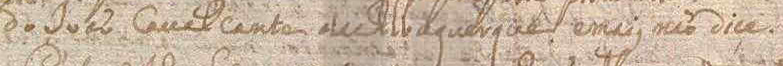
do Ioaõ Caualcante de Albuquerque, e mais naõ dice.
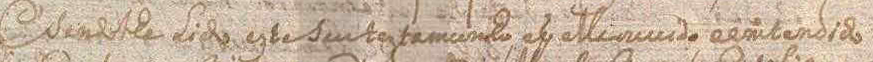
E sendolhe Lido ezte seu testamunho, e p̄ elle ouuido, e emtendido
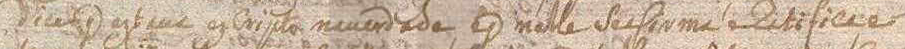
dice q̄ eztaua ezcripto na uerdade, e q̄ nelle se firma e Ratifica e
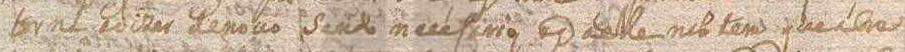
torna a dizer de nouo sendo necesario e q̄ a elle naõ tem que aCre
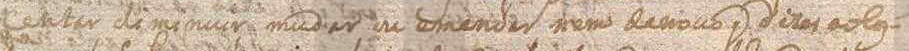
centar, diminuir, mudar, ou emendar nem de nouo q̄ dizer ao Cos
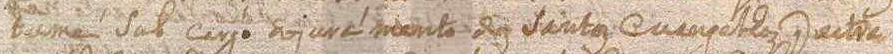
tume sob cargo do juramento doz Santoz euangelhoz q̄ outra
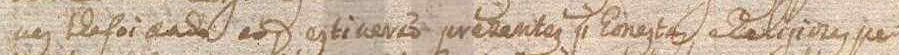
uez lhe foi dada ao q̄ estiueraõ prezentez p̄ honestas e Religiozas pe
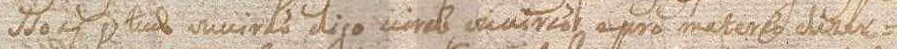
ssoas q̄ tudo ouuiraõ digo uiraõ e ouuiraõ e prometerão dizer
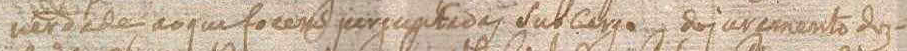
verdade ao que focem perguntadas sub cargo do juramento doz
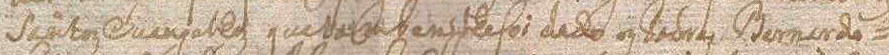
Santos Euangelhoz que tambem lhe foi dado oz Padrez Bernardo
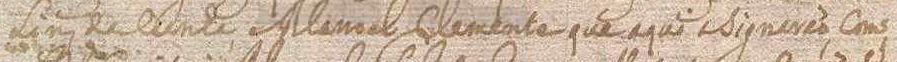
Linz da Cunha, e Manoel Clemente que aqui asignaraõ com
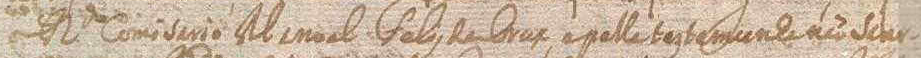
o R.do Comisario Manoel Felis da Cruz, e pella testemunha naõ Saber
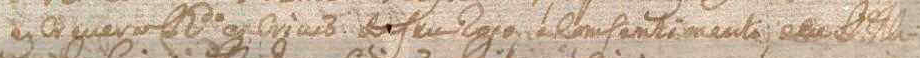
ezcreuer o R.do esCriuaõ de seu Rogo e Comsentimento, e eu P.e Ma
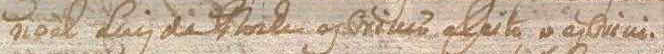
noel Luis da Rocha esCriuaõ eLeito, o esCriui.
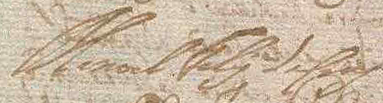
Manoel Felis da Crus
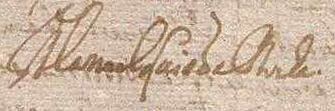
Manoel Luis da Rocha
